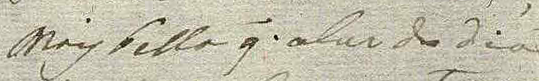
Mais bella q̄ a luz do dia,
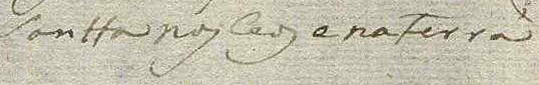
Santta nos Ceos e na Terra
